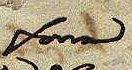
forra
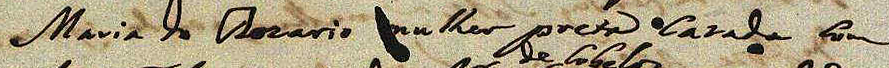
Maria do Rozario mulher preta cazada com
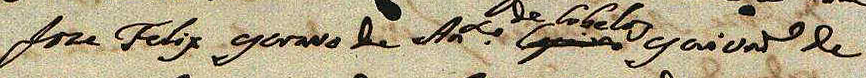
Joze Felix escravo de An.to. de Cobelos escrivaõ de
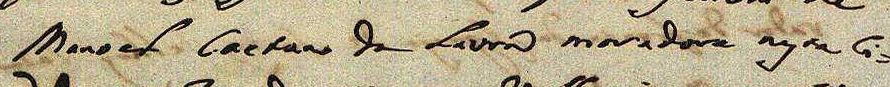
Manoel Caetano da Lavra moradora nesta Ci
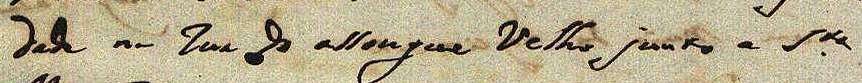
dade na Rua do assougue Velho junto a S.ta
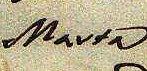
Marta
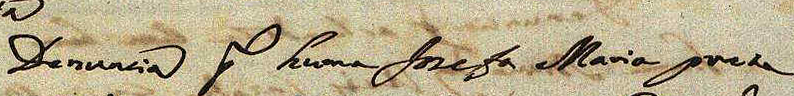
Denuncia q̄ huma Jozefa Maria preta
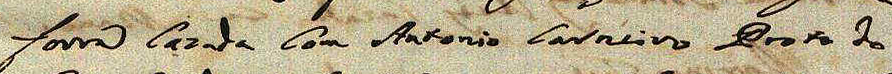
forra Cazada Com Antonio Carneiro Preto do
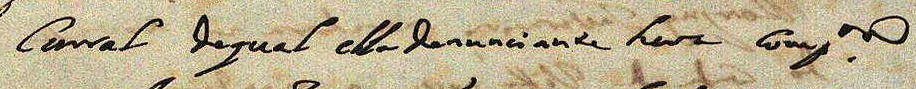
Curral de qual ella denunciante hera comp.ra
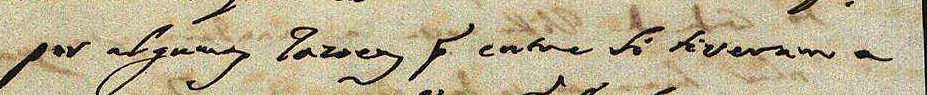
por algumas Razoens q̄ entre si tiveram a
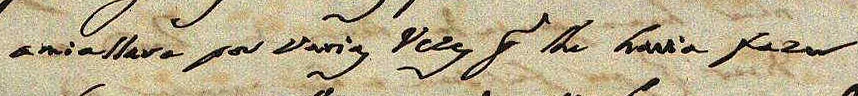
amiassara por varias Vezes q̄ lhe havia fazer
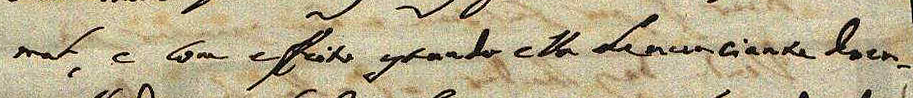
mal, e com effeito estando ella denunciante doen
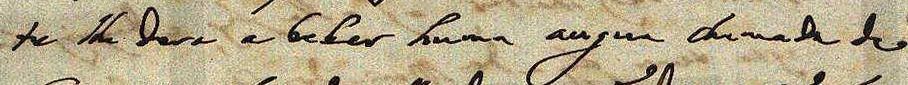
te lhe dera a beber huma augua chamada de
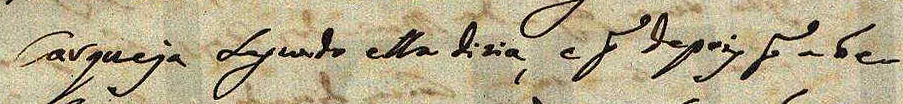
Carqueja segundo ella dizia, e q̄ depois q̄ a be
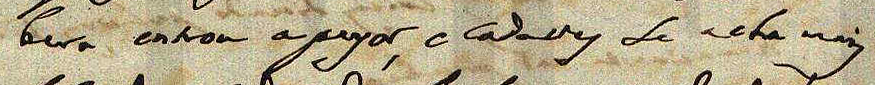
bera entrou a peyor, e cada ves se acha mais
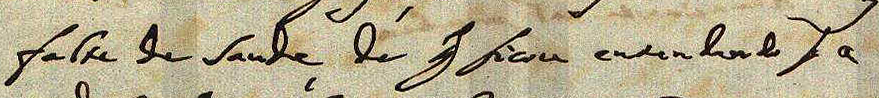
falta de saude de q̄ ficou entendendo q̄ a
